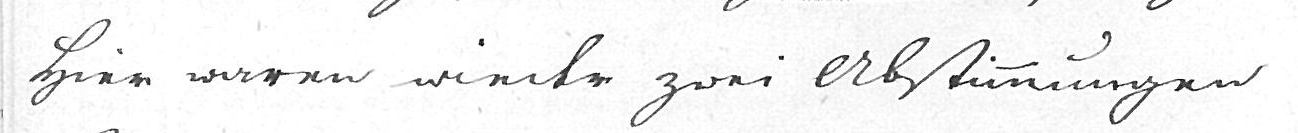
Hier waren wieder zwei Abstimmungen
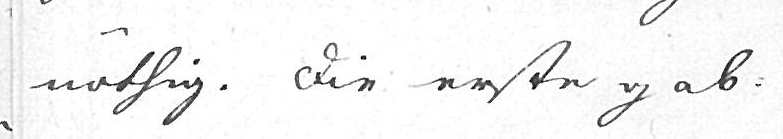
nöthig. Die erste ergab:
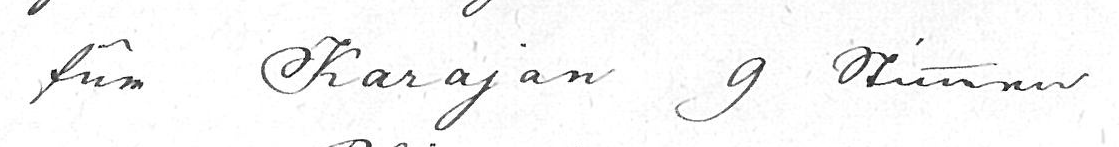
für Karajan 9 Stimmen
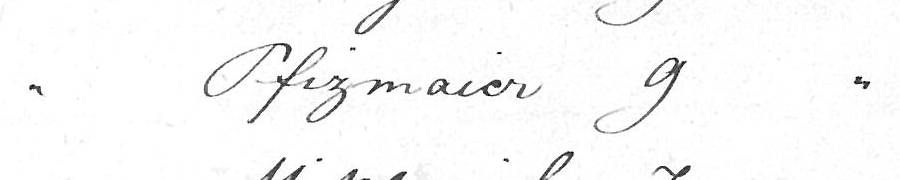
" Pfizmaier 9 "
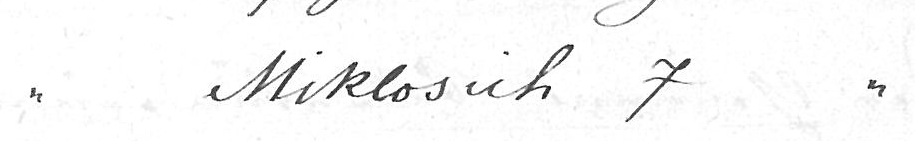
" Miklosich 7 "
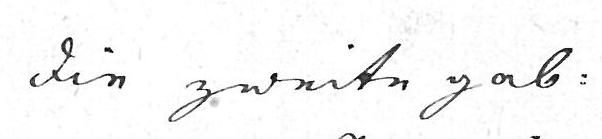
Die zweite gab:
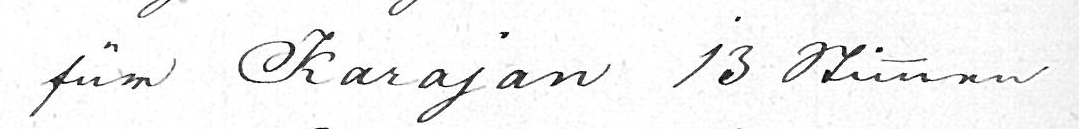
für Karajan 13 Stimmen
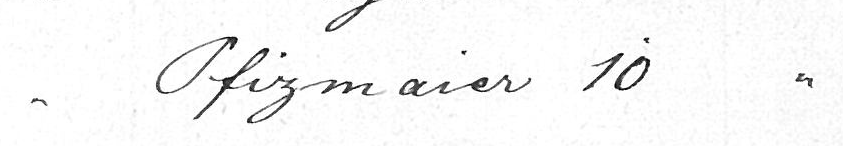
" Pfizmaier 10 "
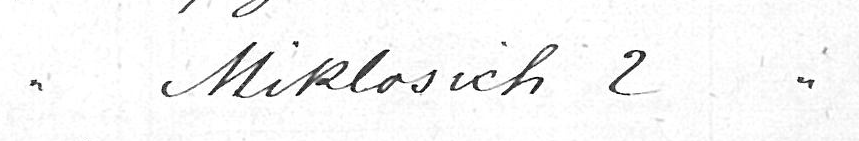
" Miklosich 2 "
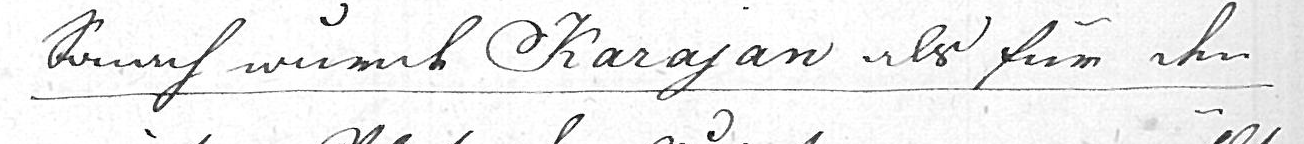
Sonach wurde Karajan als für den
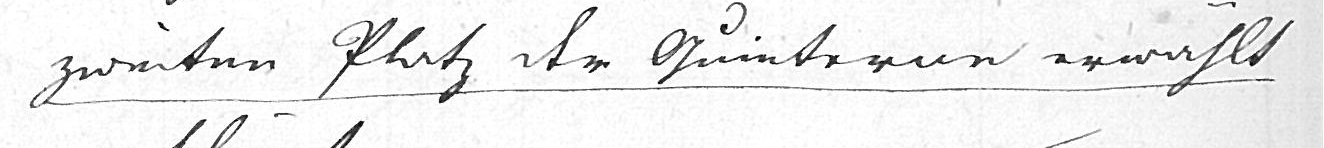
zweiten Platz der Quinterne erwählt
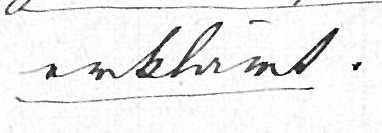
erklärt.
